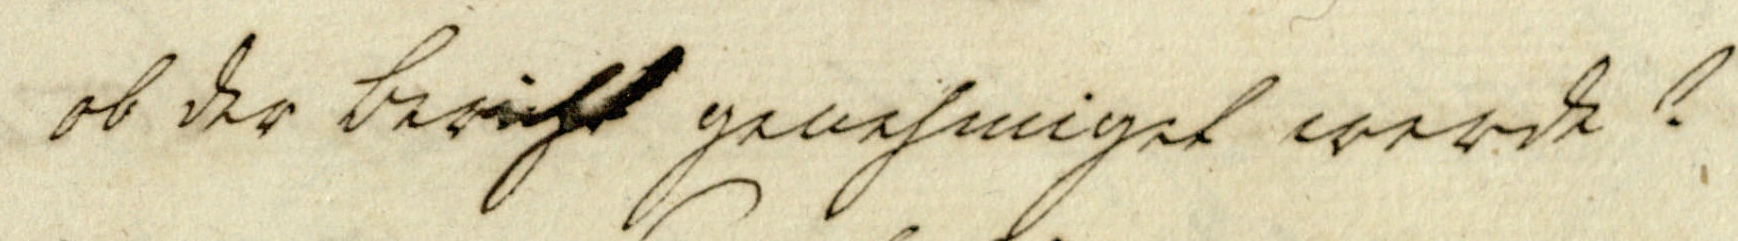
ob der Bericht genehmiget werde!
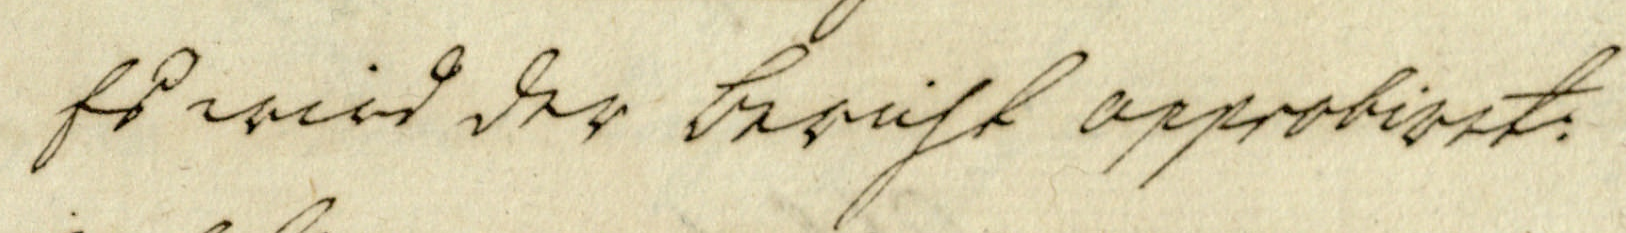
Es wird der Bericht approbiret.
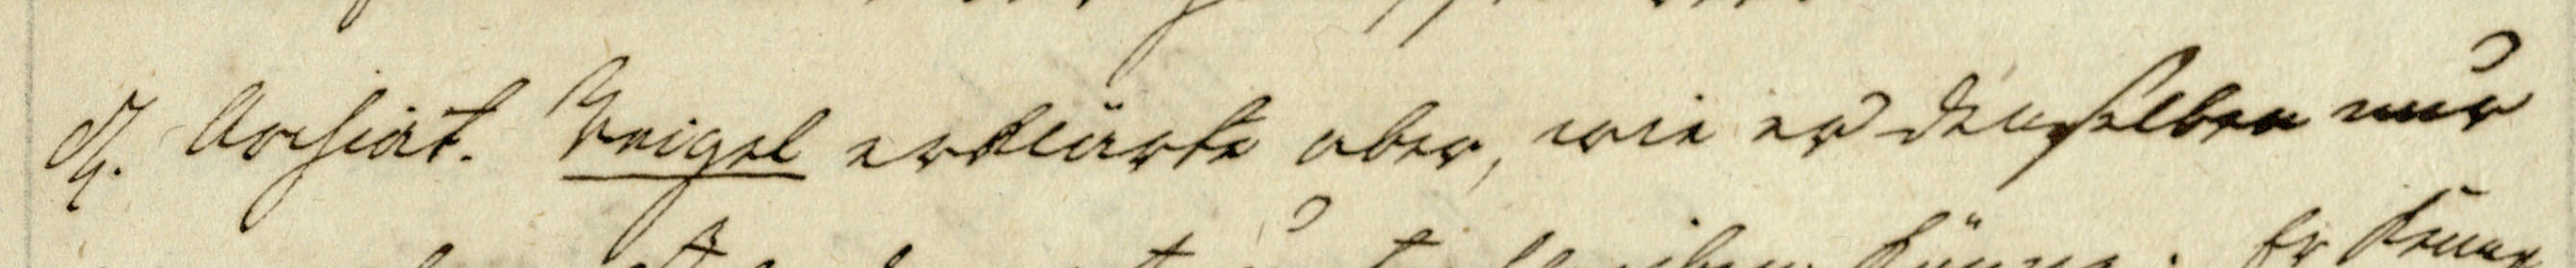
dh. Archiat. Weigel erklärte aber, wie er denselben nur
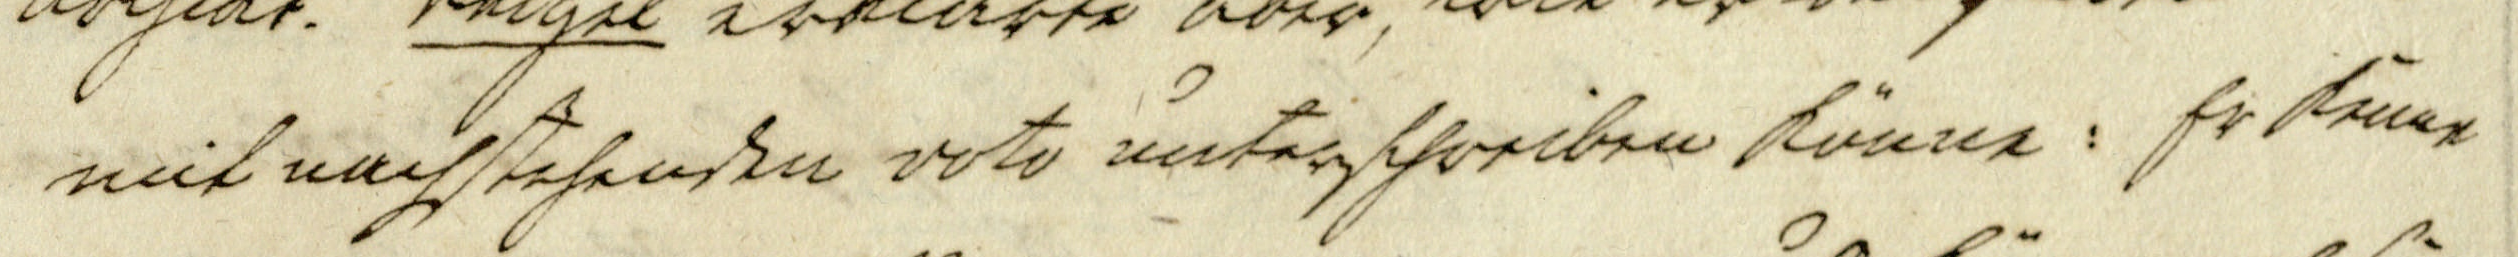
mit nachstehenden voto unterschreiben könne: Er kenne
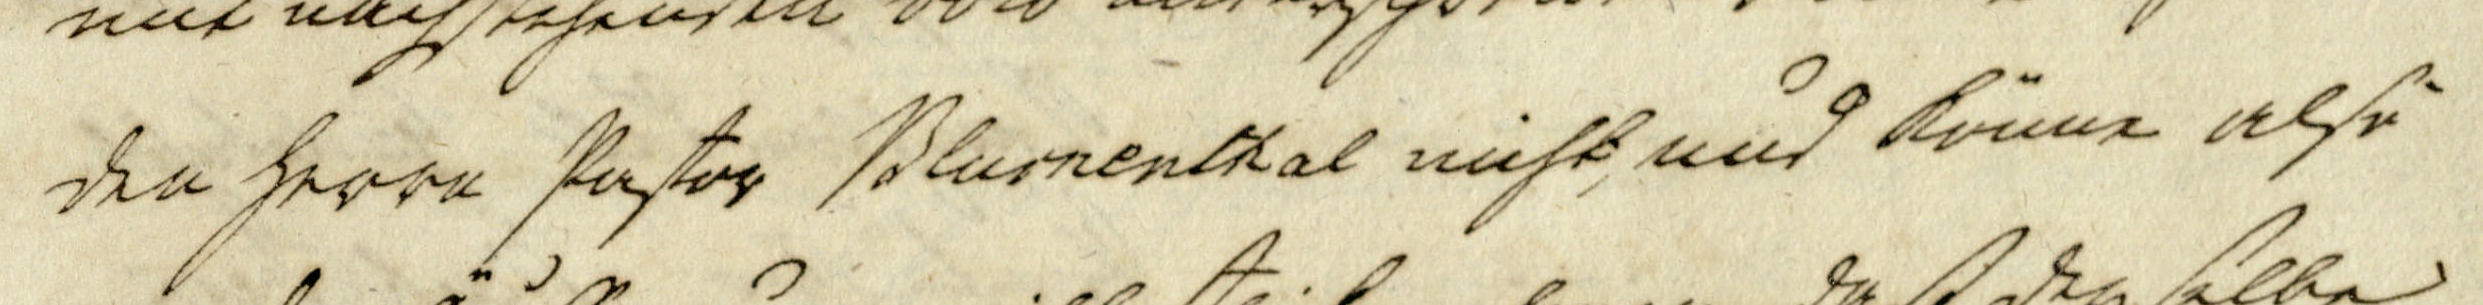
den herrn Pastor Blumenthal nicht, und könne also
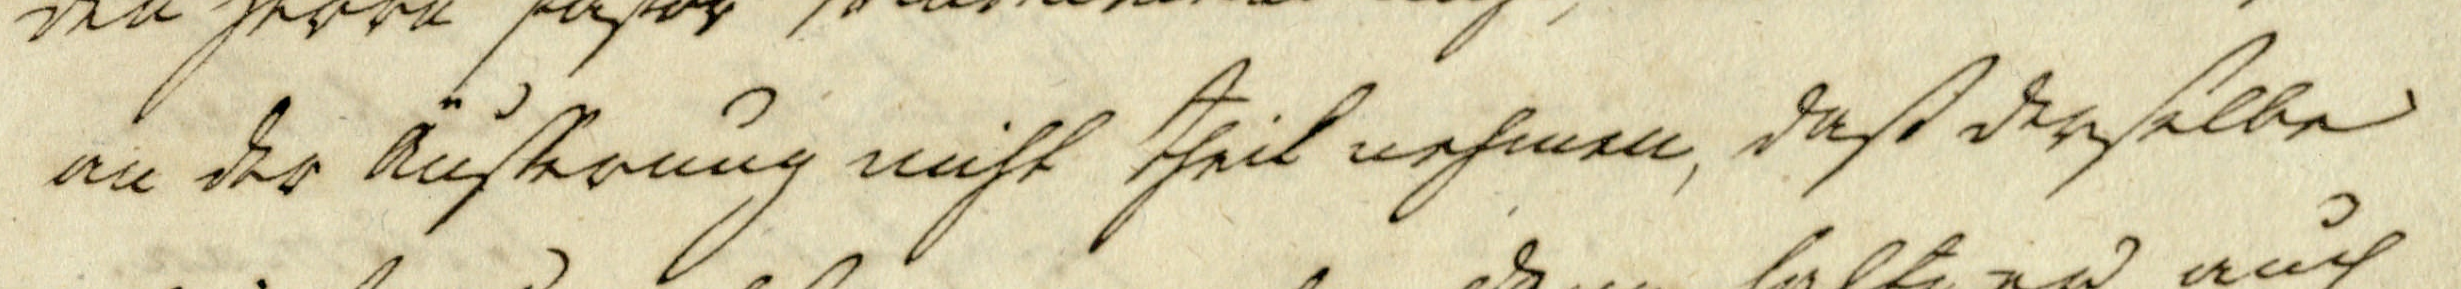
an der Äusserung nicht theil nehmen, daß derselbe
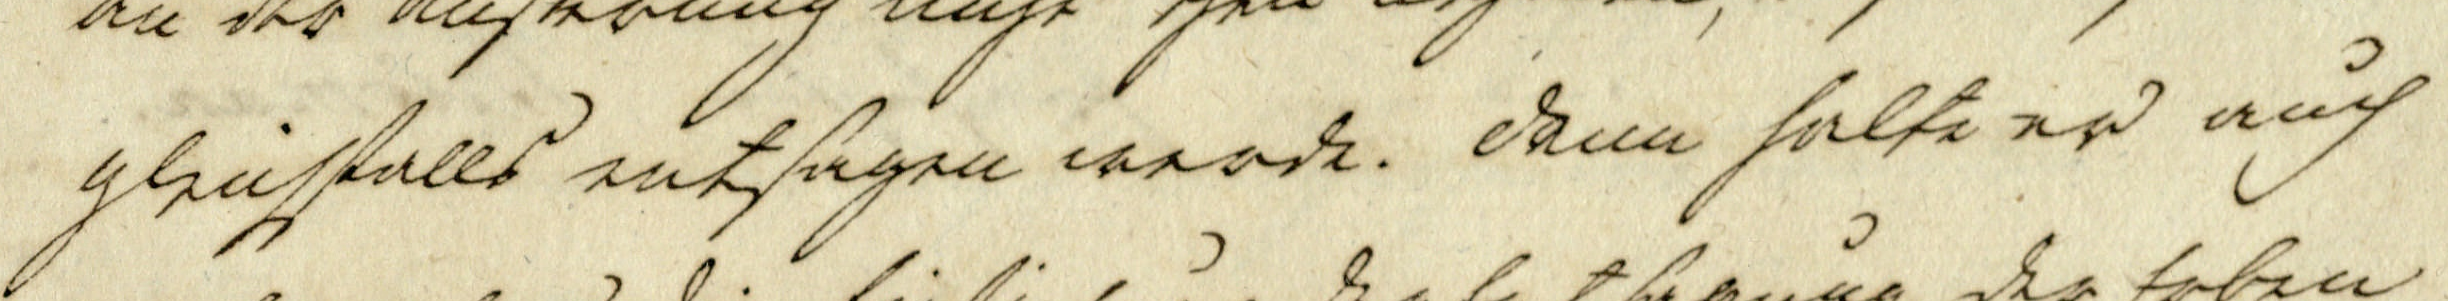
gleichfalls entsagen werde. Dann halte er auch
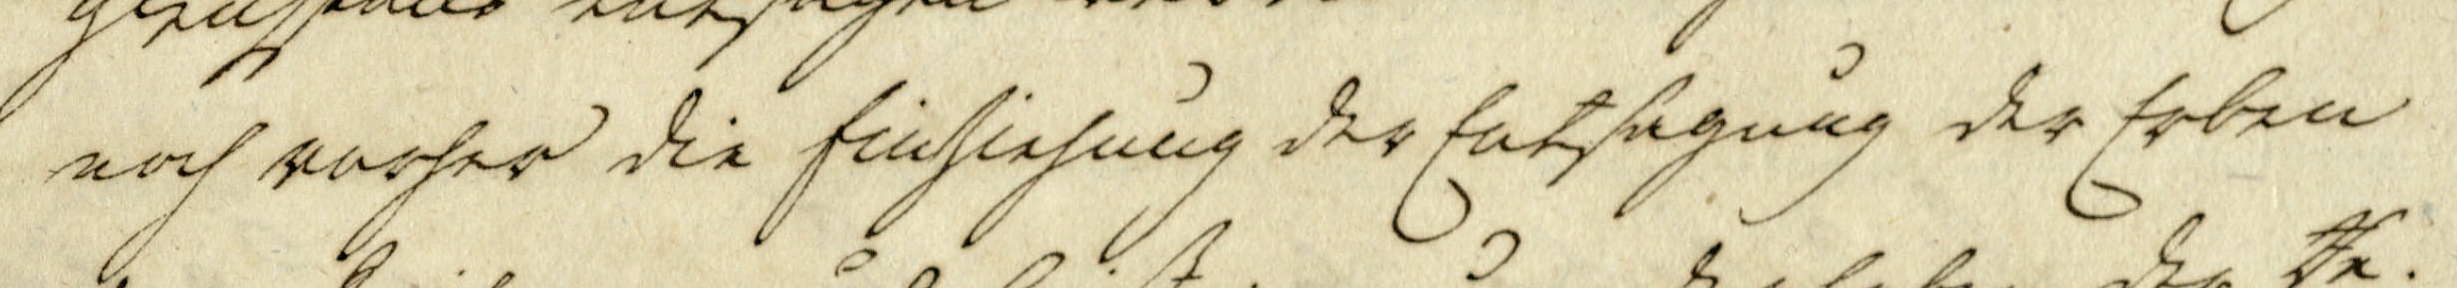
noch vorher die Einziehung der Entsagung der Erben
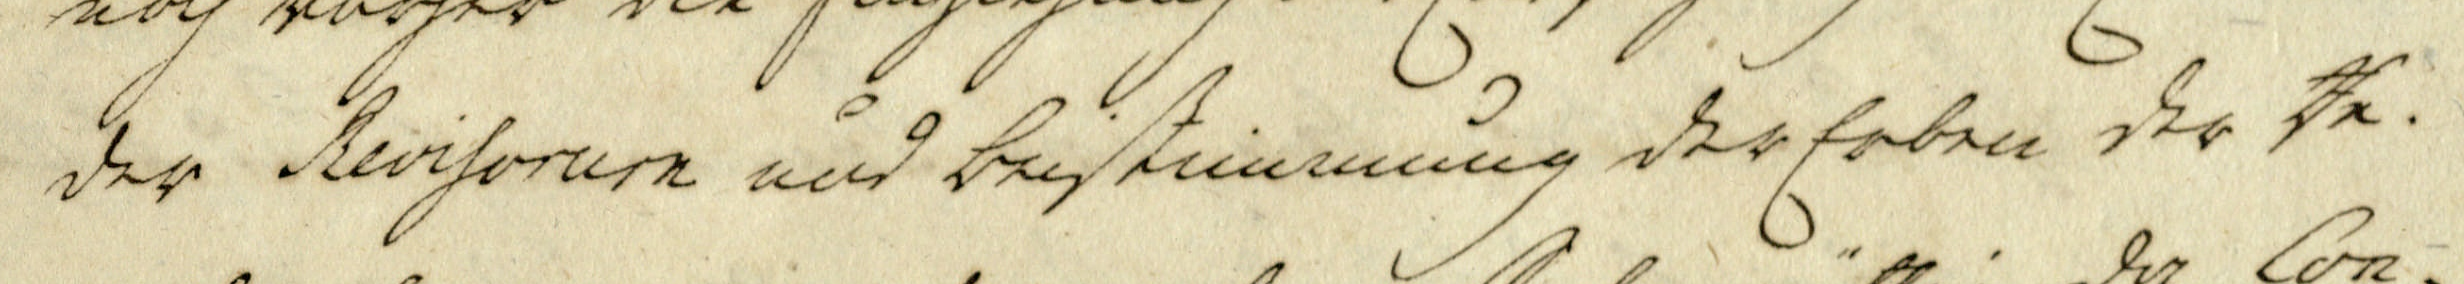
der Revisorum und Bestimmung der Erben der Re¬
